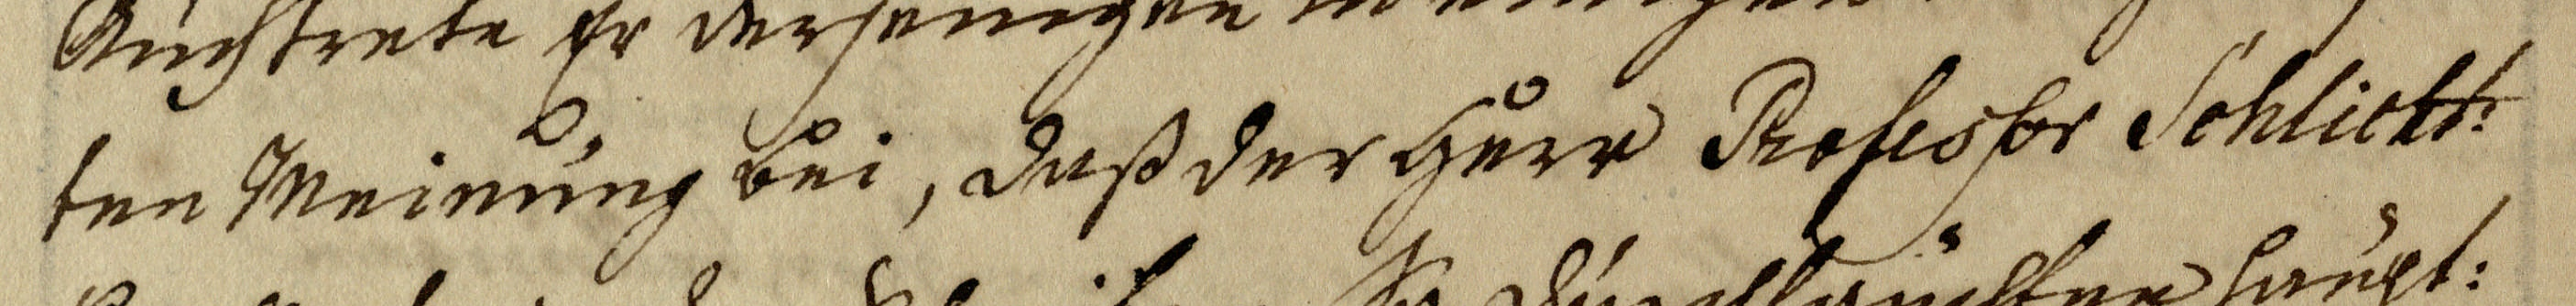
ten Meinung bei, daß der Herr Professor Schlicht¬
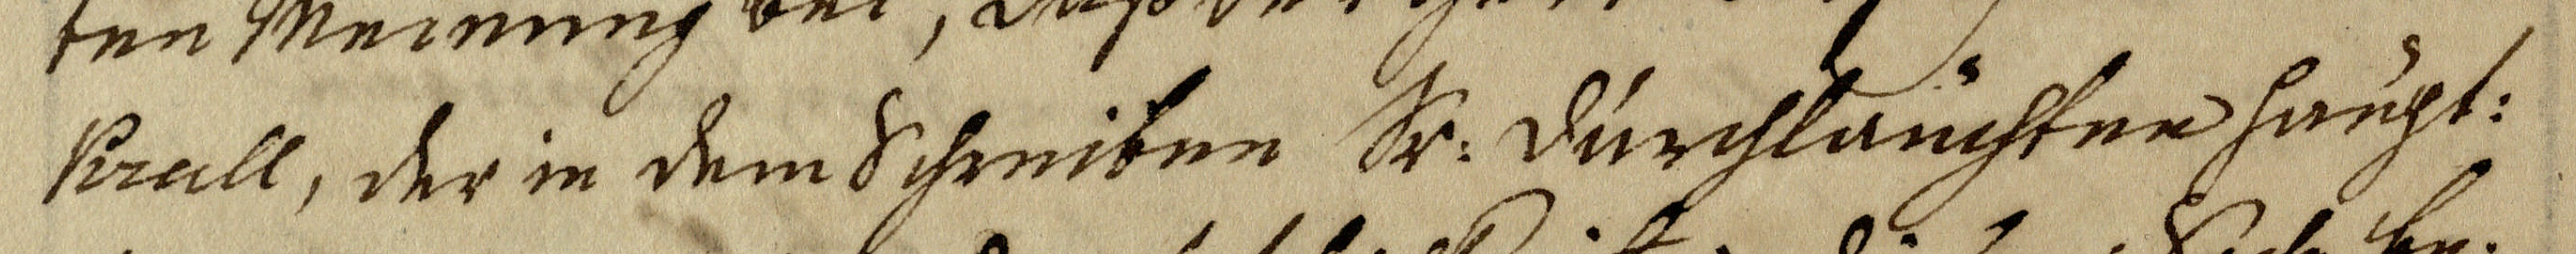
krull, der in dem Schreiben Sr. Durchlauchten haupt¬
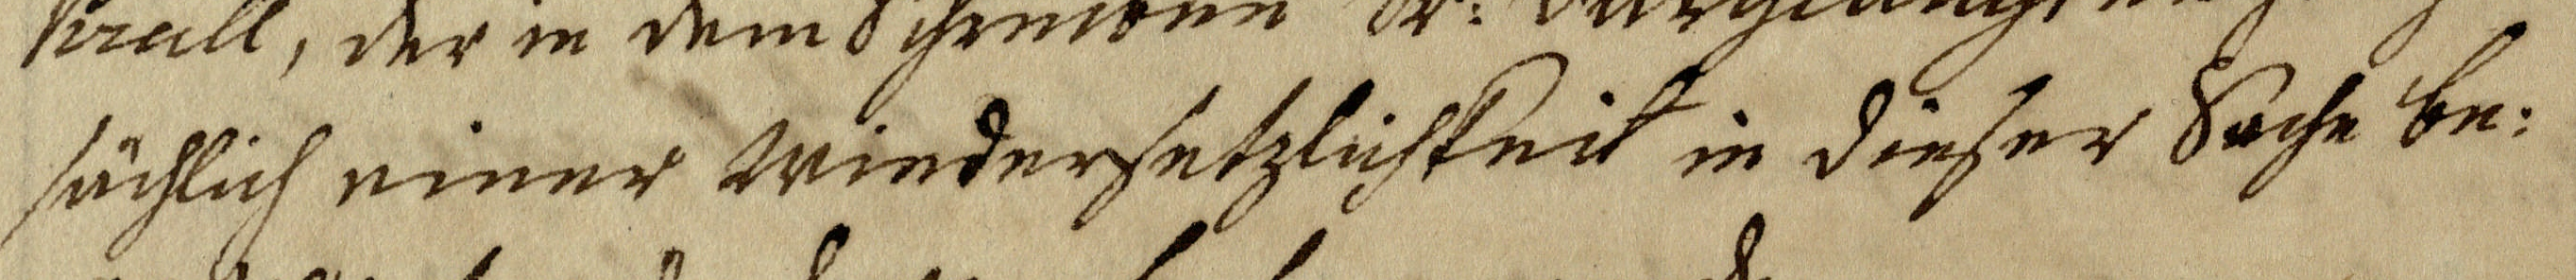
hächlich einer Wiedersetzlichkeit in dieser Sache be¬
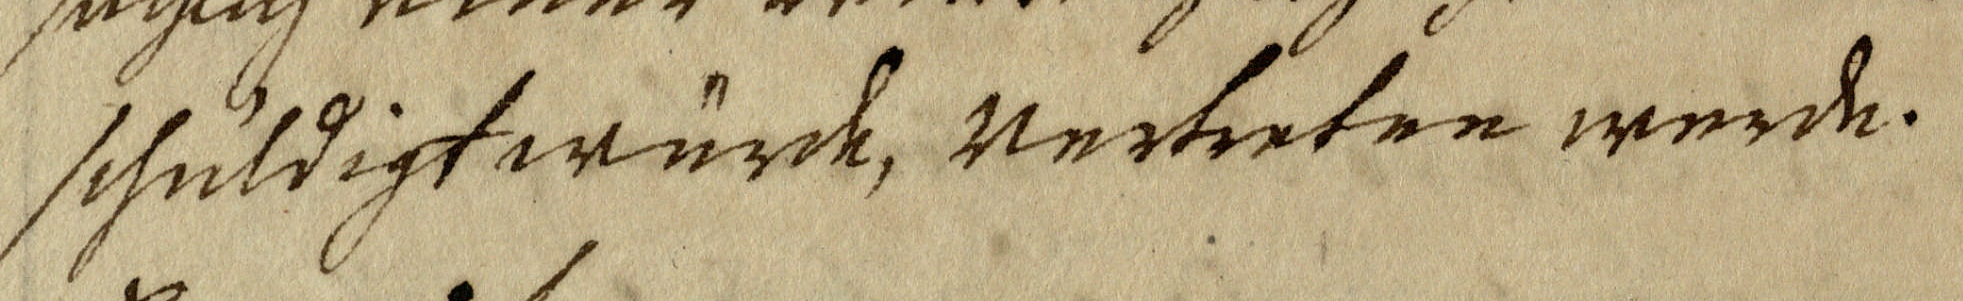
schuldigt würde, verreten werde.
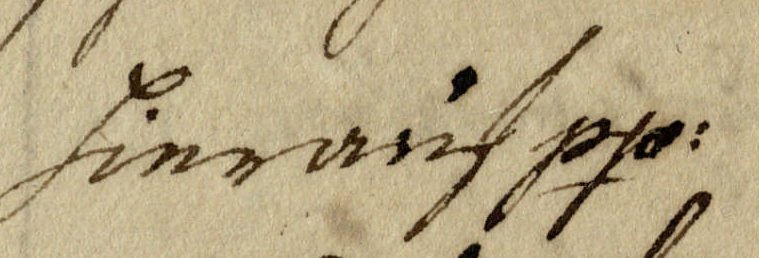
hierauf pp.
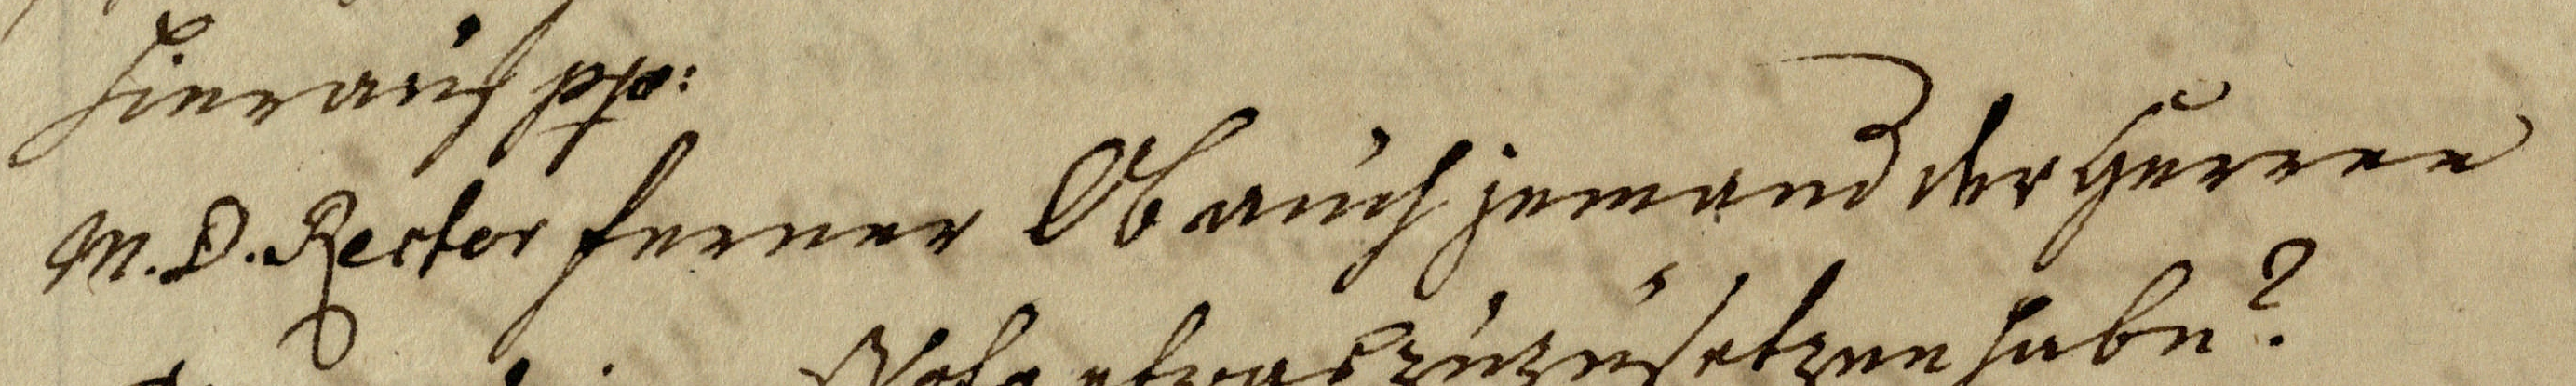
M. D. Rector ferner Ob auch jemand der Herren
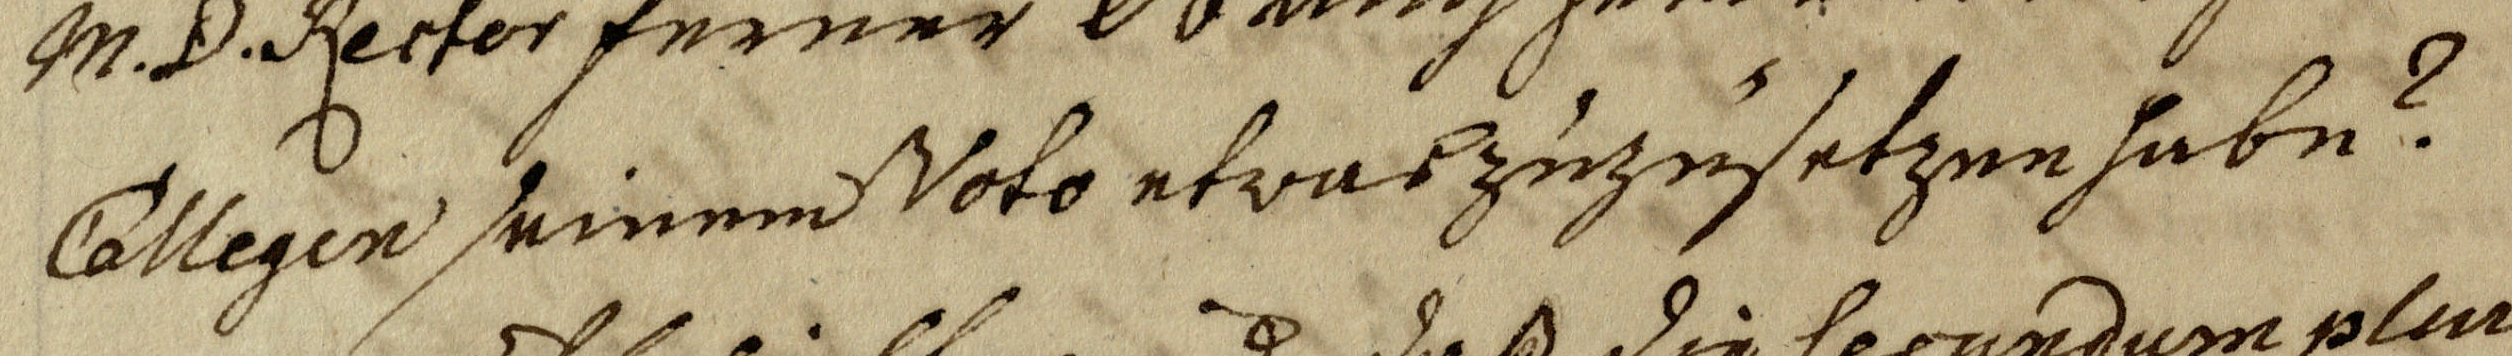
Collegen seinem Voto etwas zuzusetzen habe?
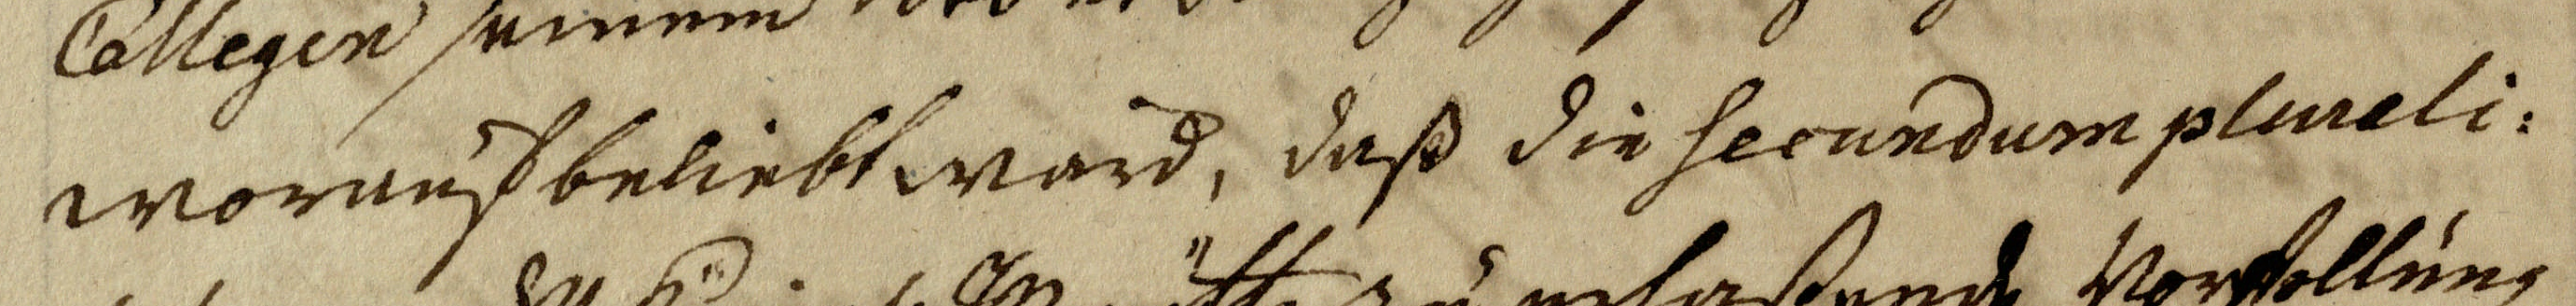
worauf beliebt ward, daß die secundum plurali¬
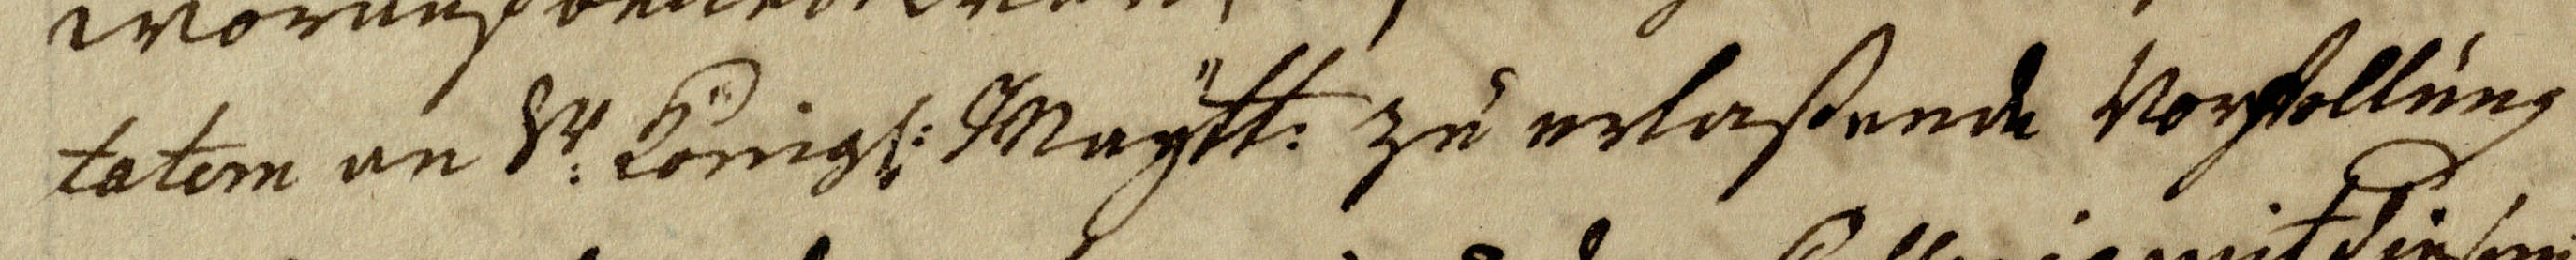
tatem an Sr. Königl. Maÿtt. zu erlaßende Vorstellung
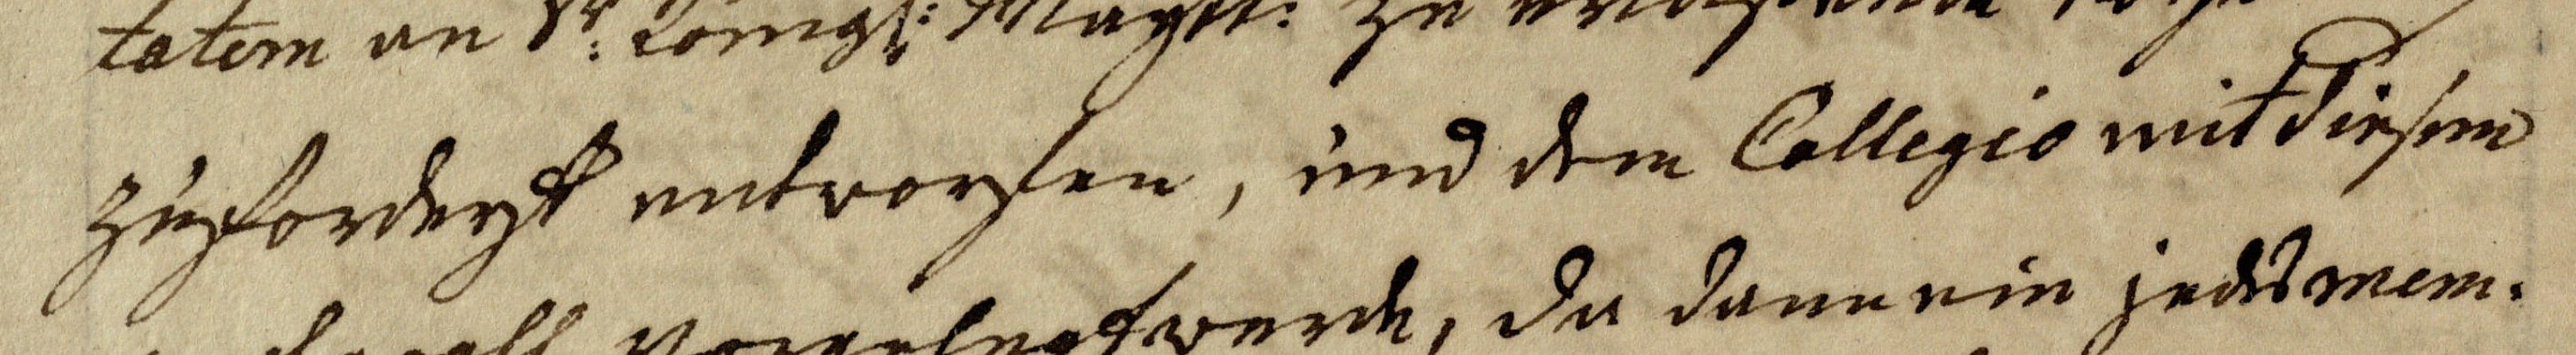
zuforderst entworfen, und dem Collegio mit diesem
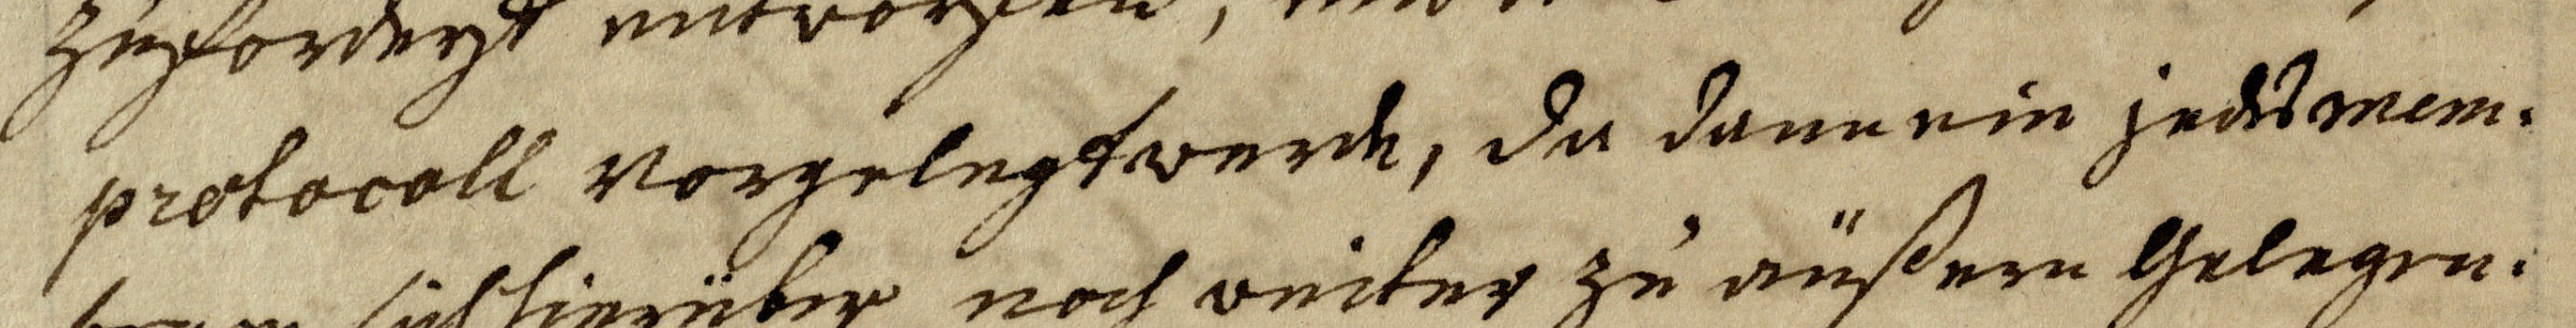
protocoll vorgelegt werde, da dann ein jedes mem¬
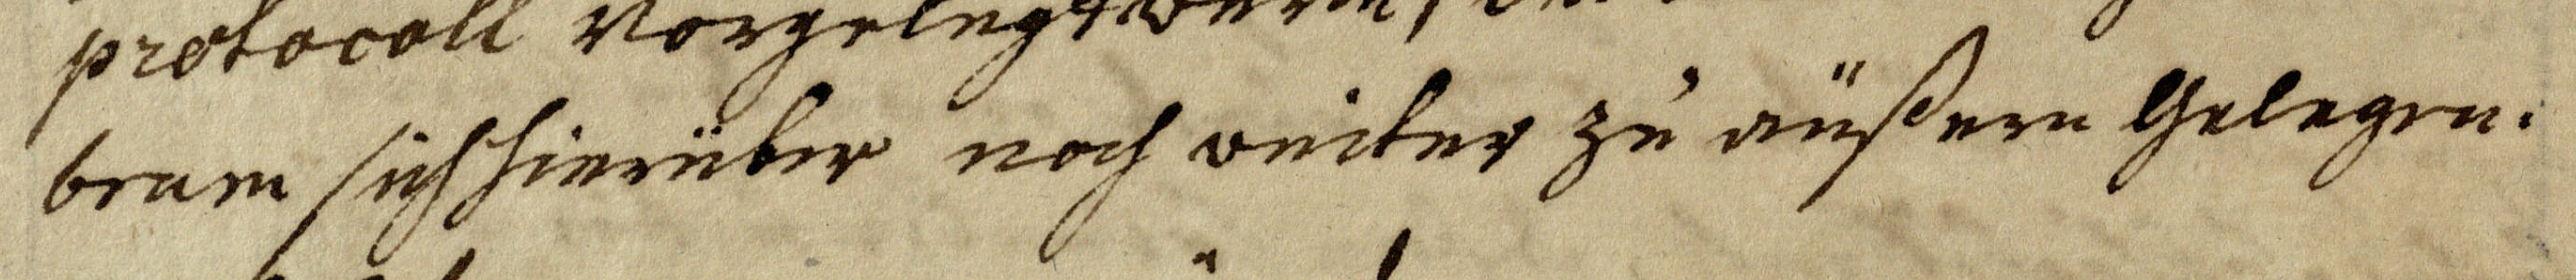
brum sich hierüber noch weiter zu äußern Gelegen¬
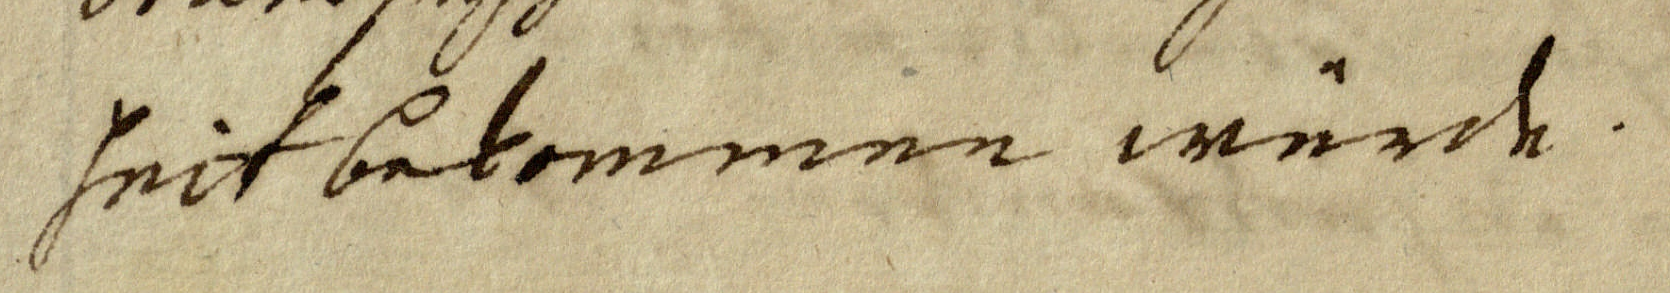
heit bekommen würde.
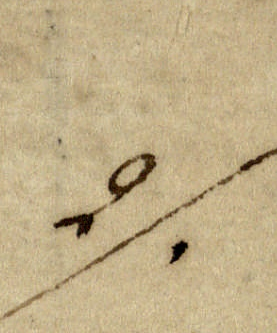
2.
